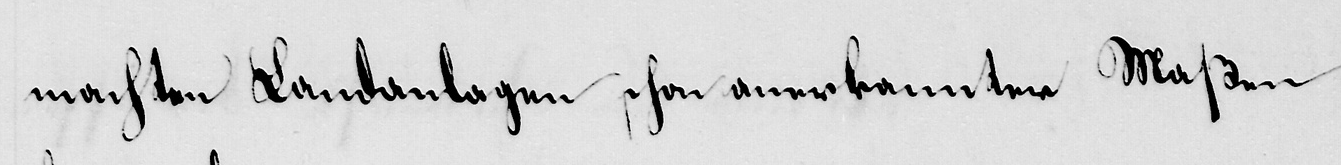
machten Landanlagen schon anerkannter Maßen
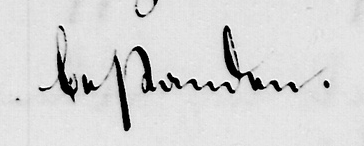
bestanden.
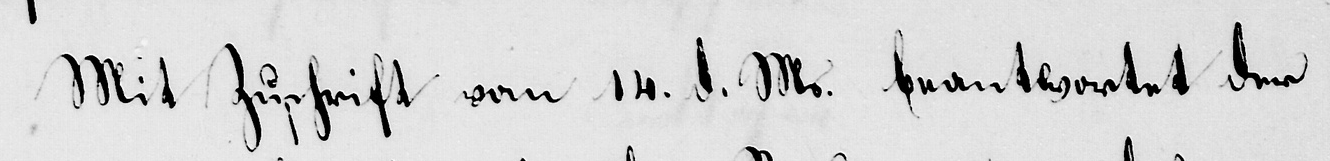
Mit Zuschrift vom 14. d. Ms. beantwortet der
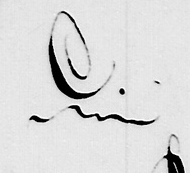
C.
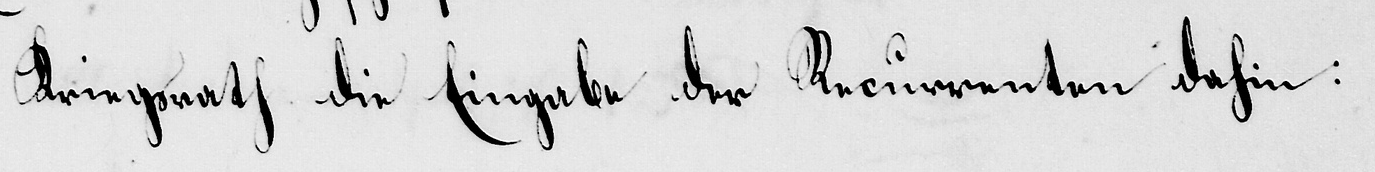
Kriegsrath die Eingabe der Recurrenten dahin:
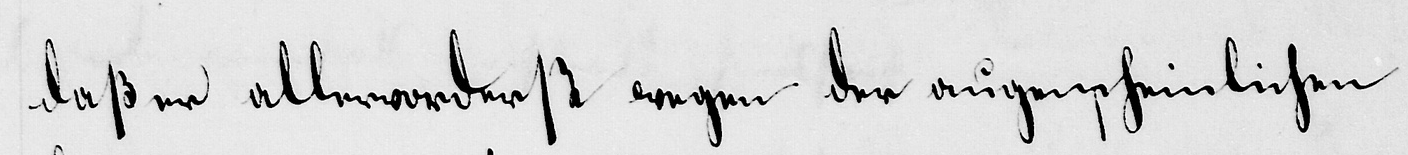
daß er allervorderst wegen der augenscheinlichen
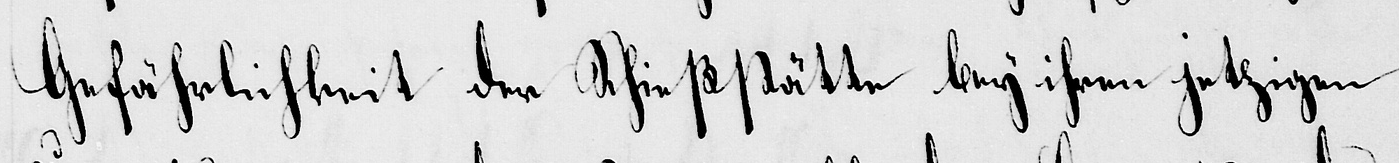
Gefährlichkeit der Schießstätte bey ihren jetzigen
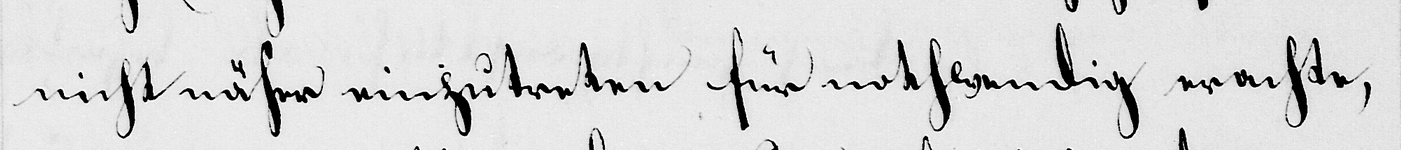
nicht näher einzutreten für nothwendig erachte,
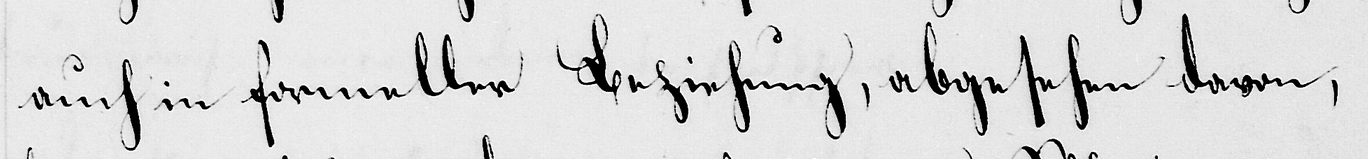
auch in formeller Beziehung, abgesehen davon,
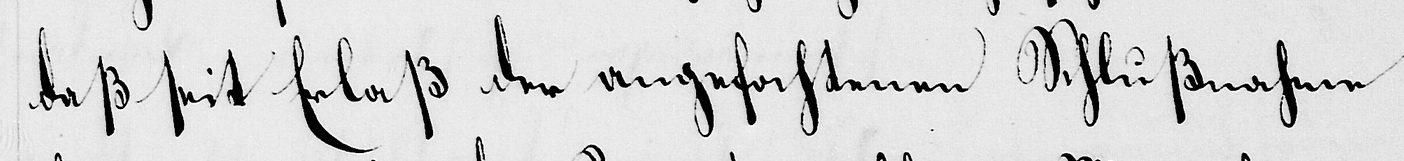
daß seit Erlaß der angefochtenen Schlußnahme
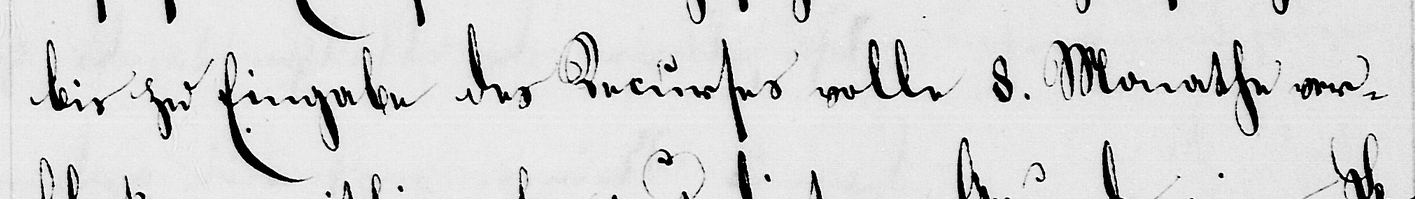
bis zu Eingabe des Recurses volle 8. Monathe ver¬
